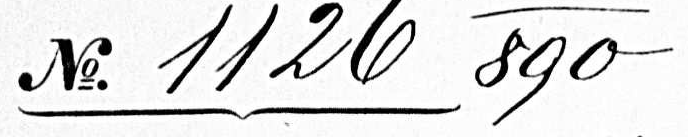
N° 1126 890
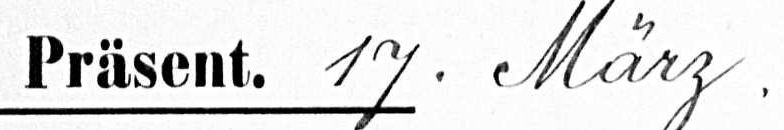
Präsent. 17. März.
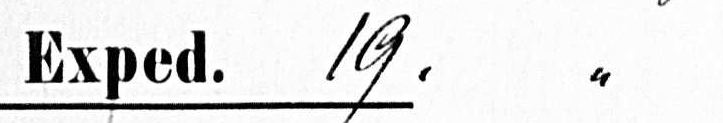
Exped. 19. März.
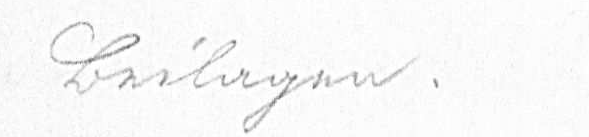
Beilagen.
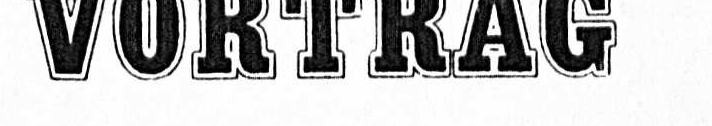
VORTRAG
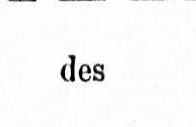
des
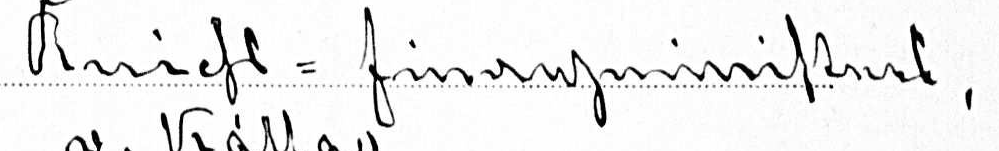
Reichs-Finanzministers,
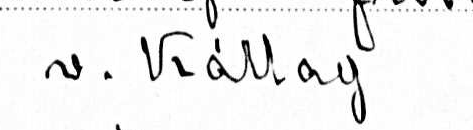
v. Kállay
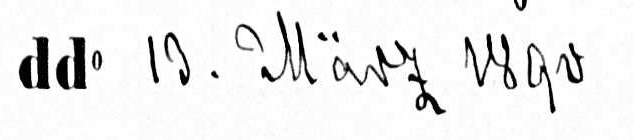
dd° 13. März 1890
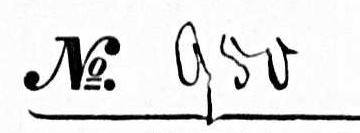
N° 950
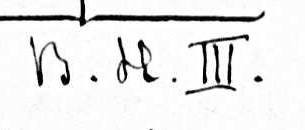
B. H. III.
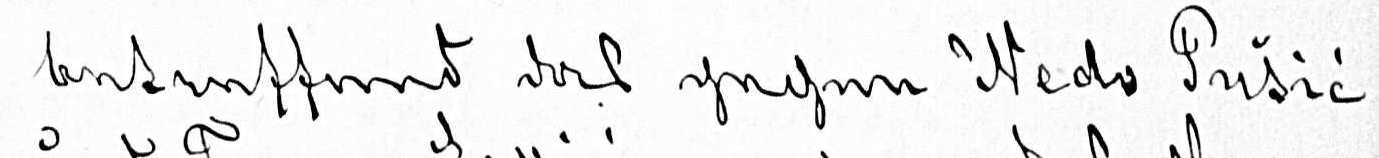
betreffend das gegen Nedo Pušić
